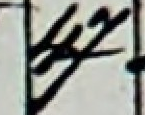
47
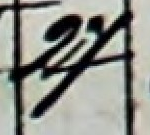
27
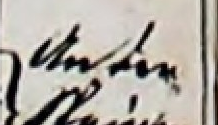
An der
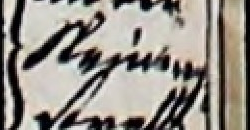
Steinberg„
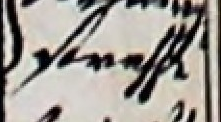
strasse
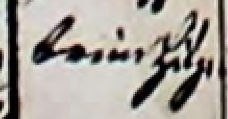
beim Hitze
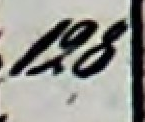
128
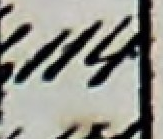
114
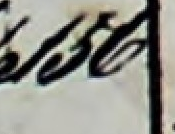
156
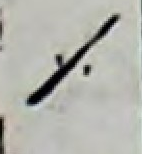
./.
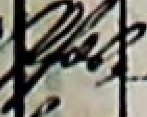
Pfds„
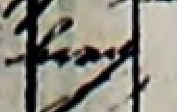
berg
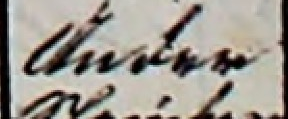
An der
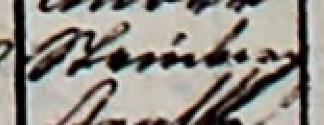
Steinberg„
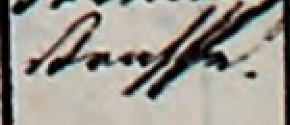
strasse
